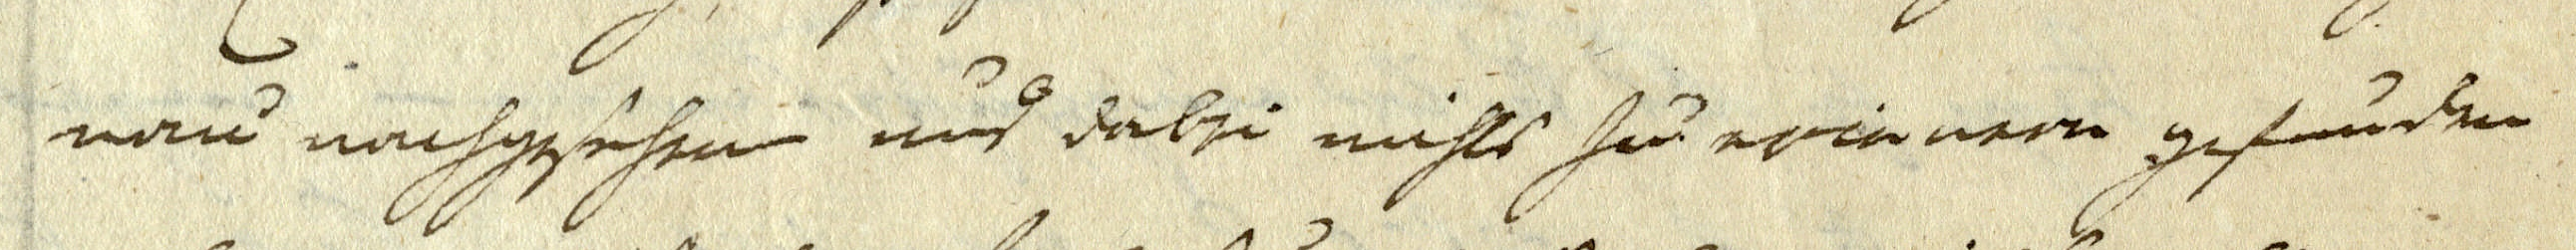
nau nachgesehen und dabei nichts zu erinnern gefunden
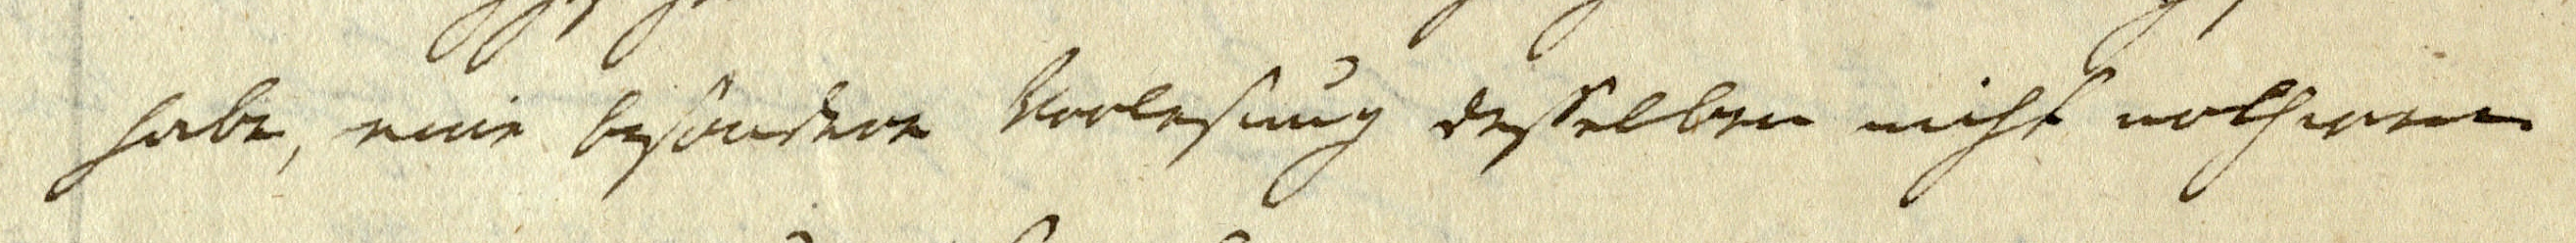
habe, eine besondere Vorlesung desselben nicht nothwen¬
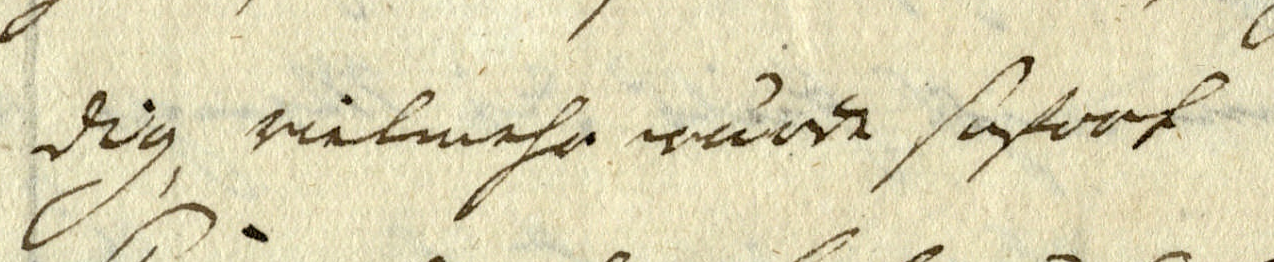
dig, vielmehr wurde sofort
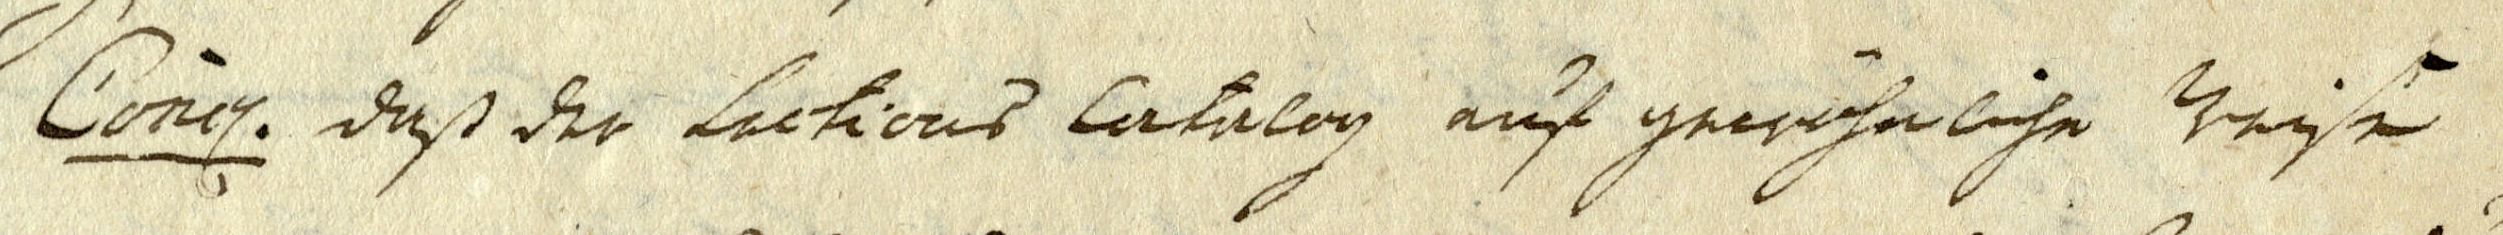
Concl. daß der Lections Catalog auf gewöhnliche Weise
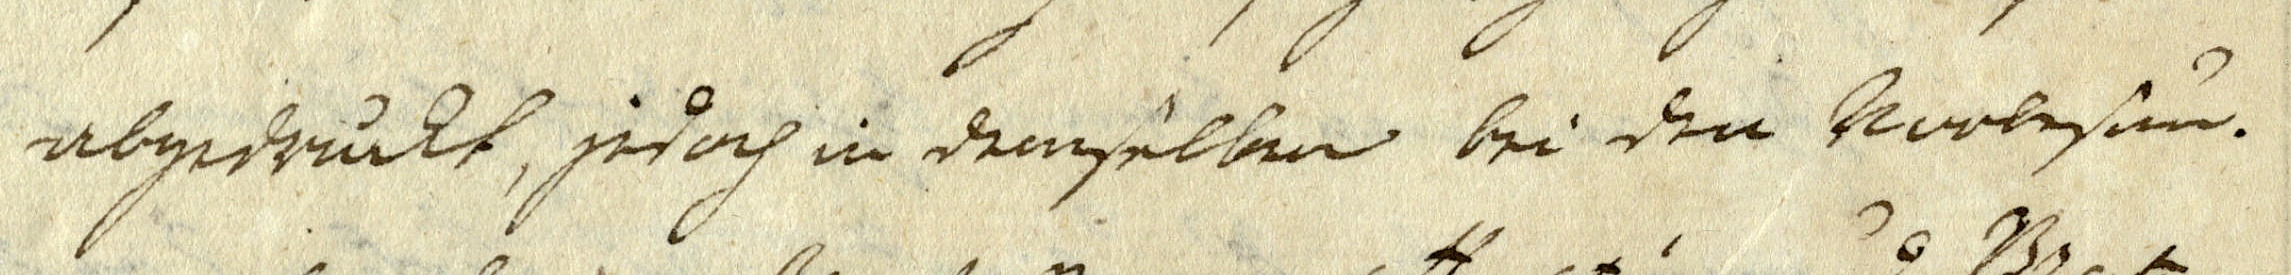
abgedruckt, jedoch in demselben bei den Vorlesun¬
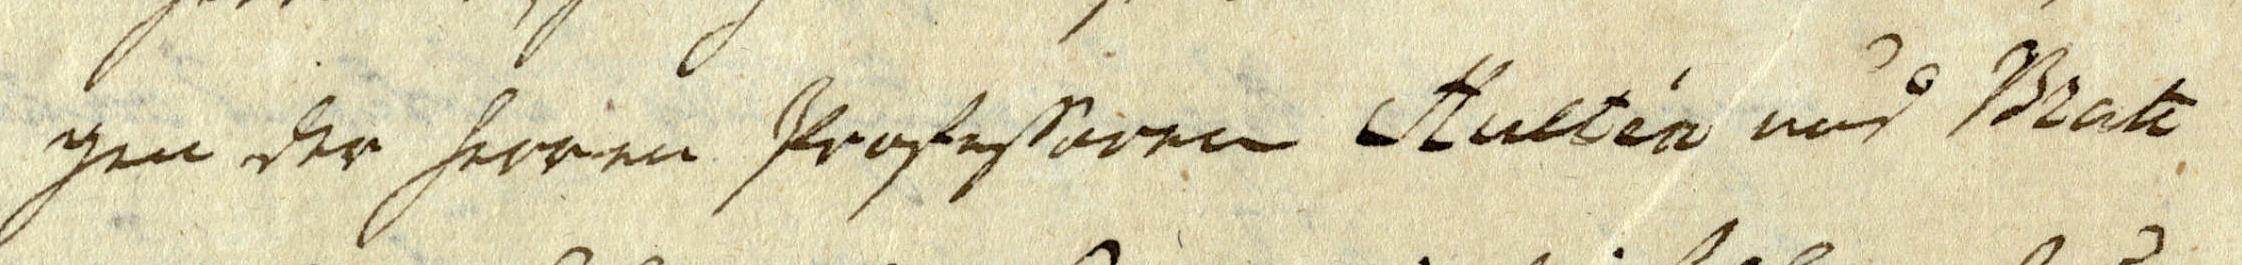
gen der Herren Professoren Hultén und Bratt
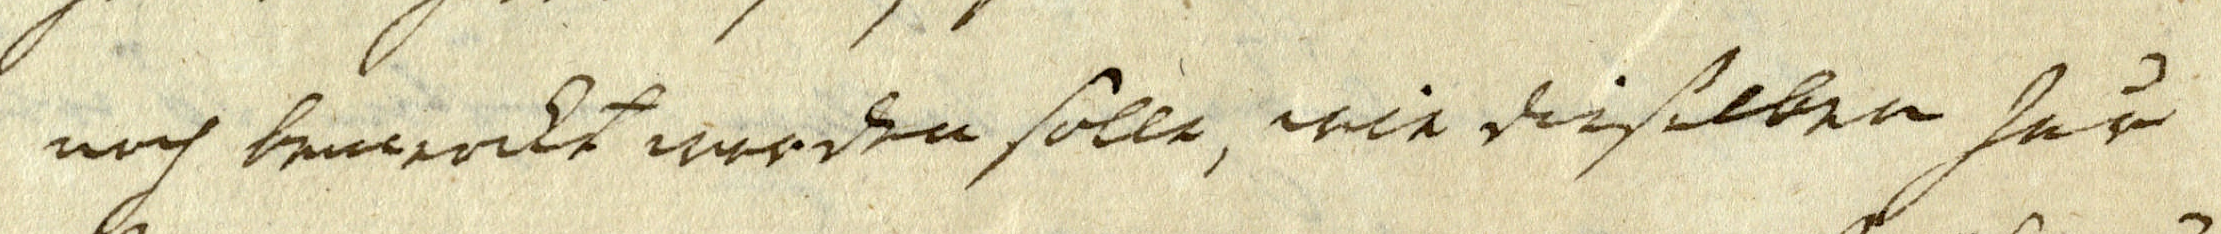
noch bemerckt werden solle, wie dieselben zur
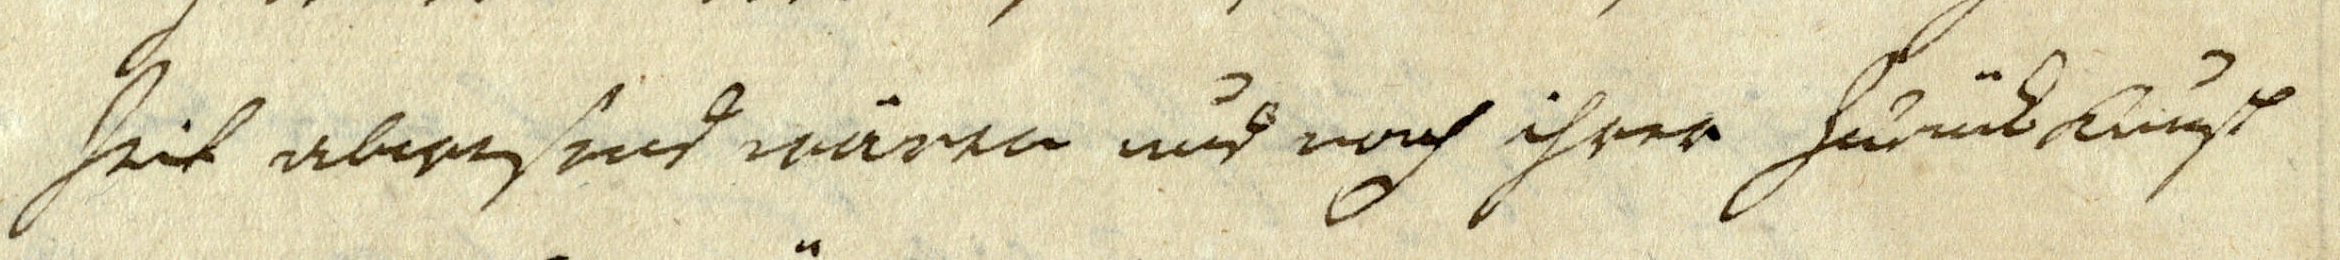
Zeit abwesend wären und nach ihrer Zurückkunft
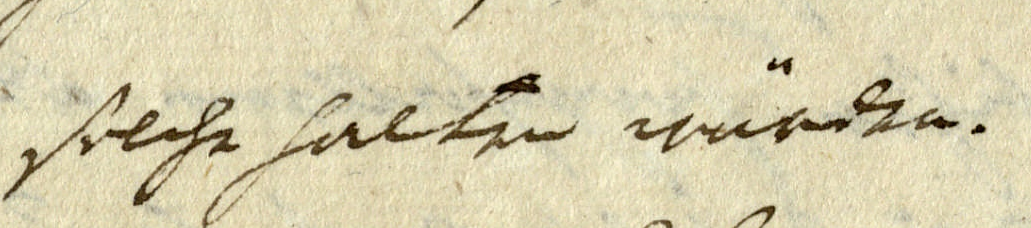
solche halten würden.
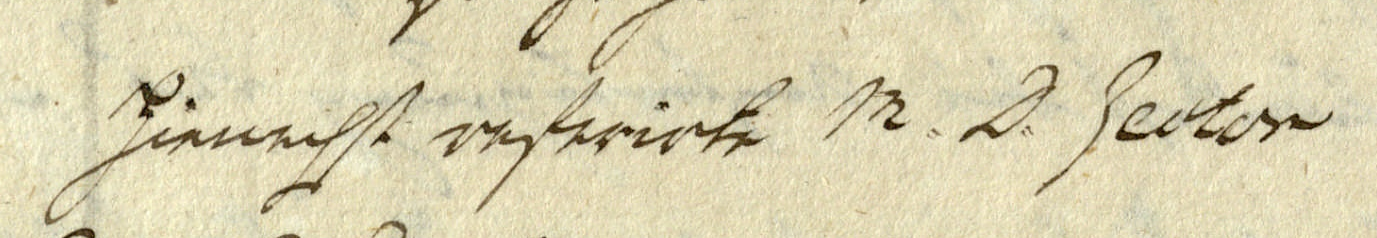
Hienechst referirte M. D. Rector
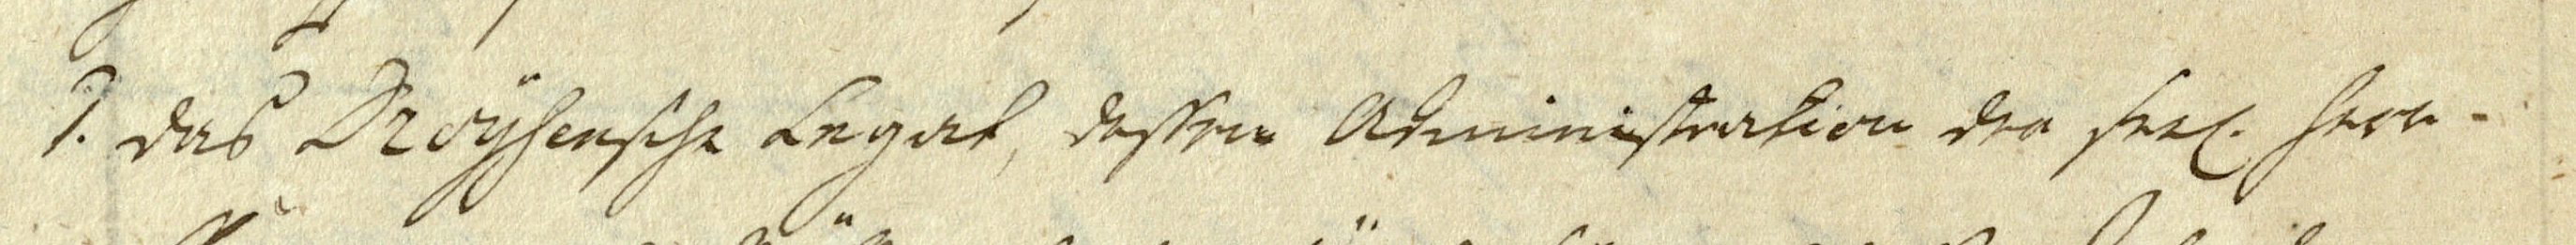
1. das Droÿsensche Legat, dessen Administration der seel. Herr
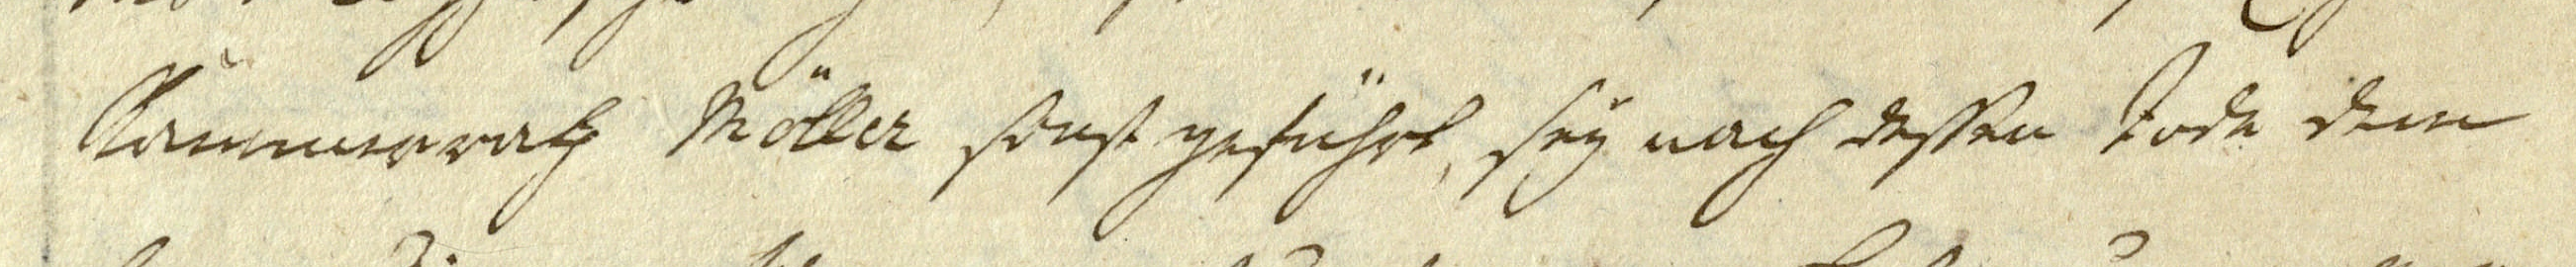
Kammerrath Möller sonst geführt, seÿ nach dessen Tode dem
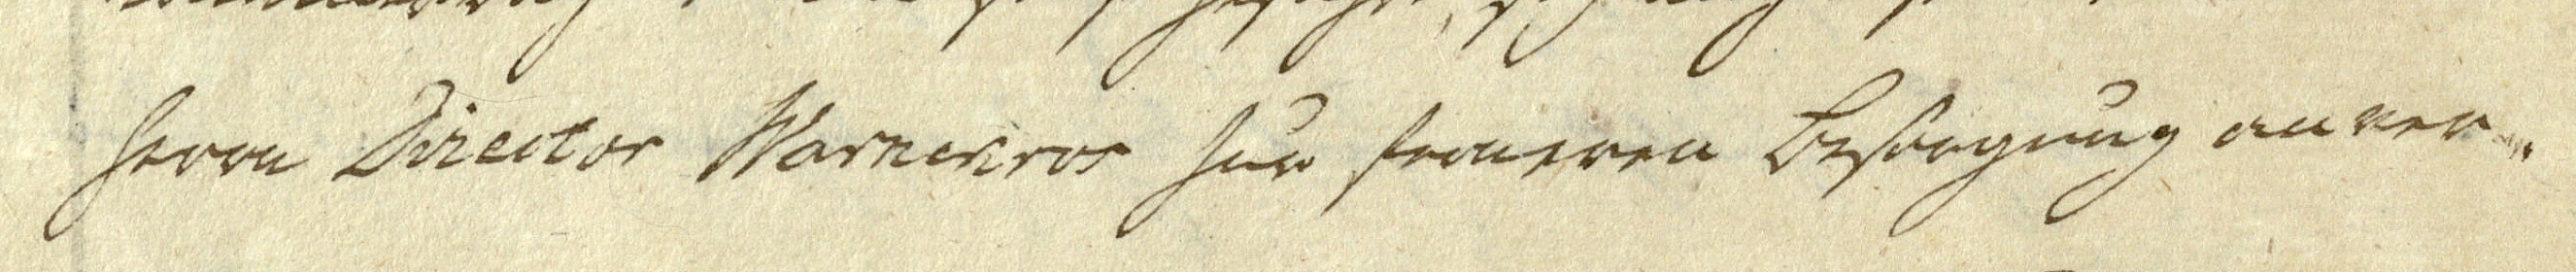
Herrn Director Warnekros zur ferneren Besorgung anver¬
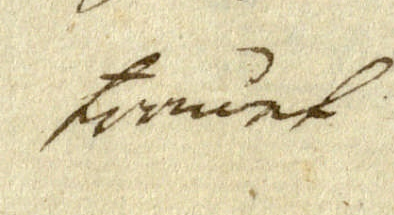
trauet
